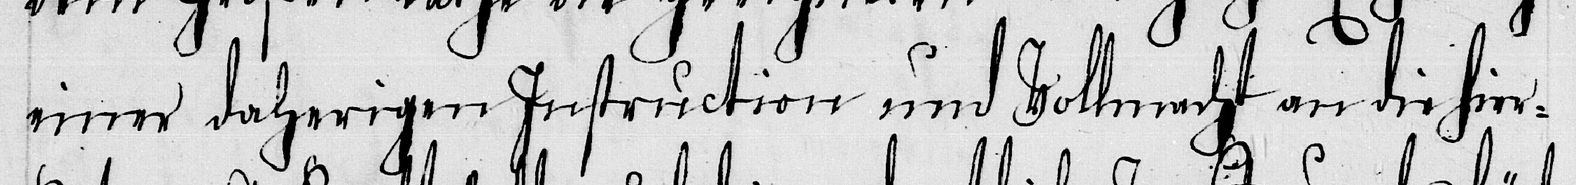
einer daherigen Instruction und Vollmacht an die hier¬
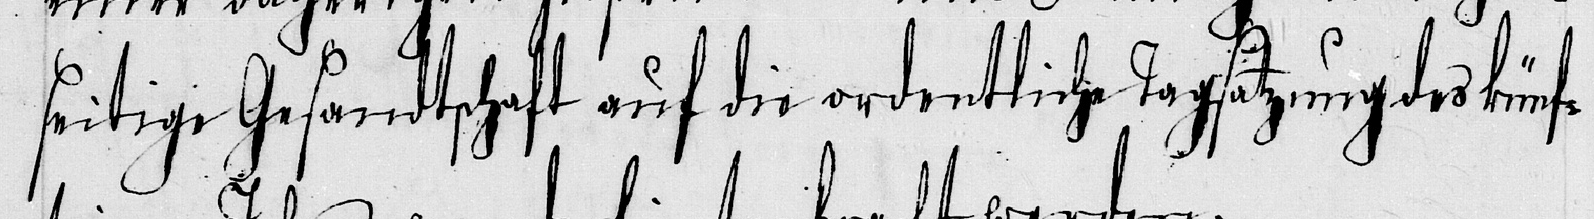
seitige Gesandtschaft auf die ordentliche Tagsatzung
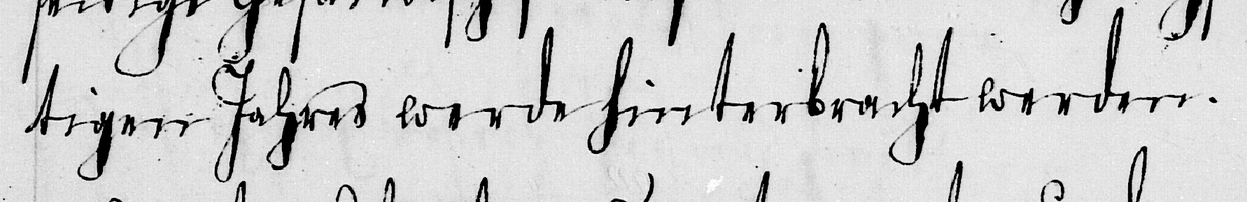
tigen Jahres werde hinterbracht werden.
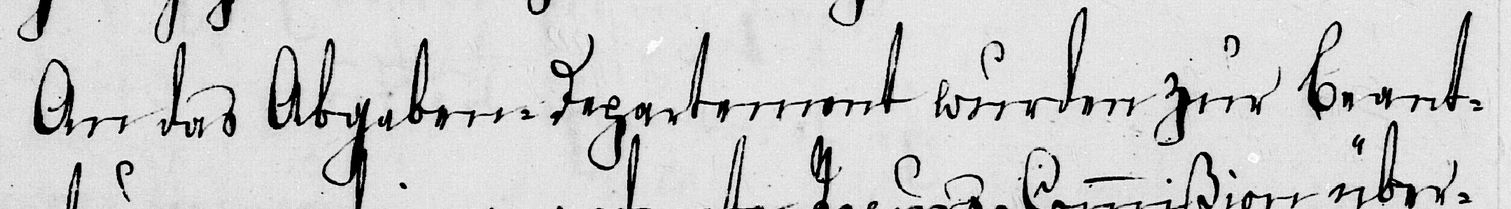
An das Abgaben-Departement wurden zur Beant¬
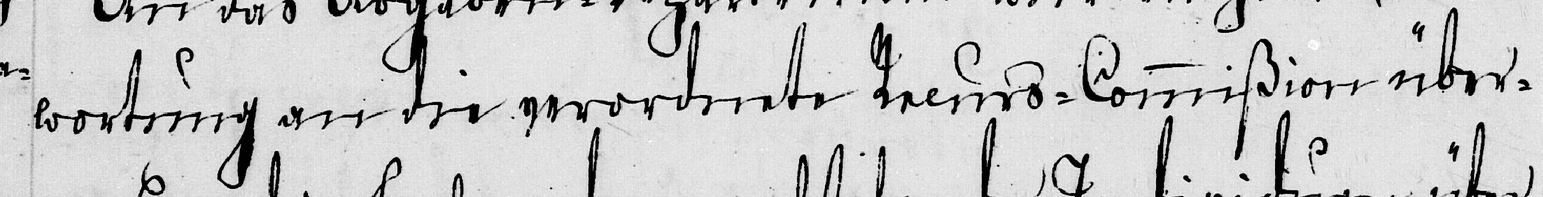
wortung an die verordnete Recurs-Commißion über¬
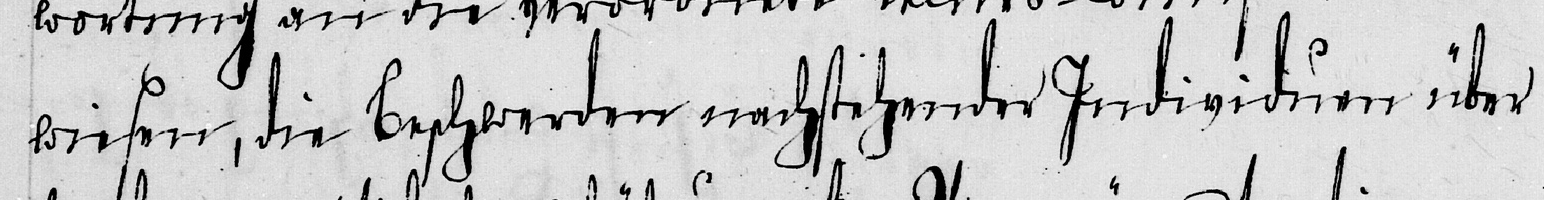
wiesen, die Beschwerden nachstehender Individuen über
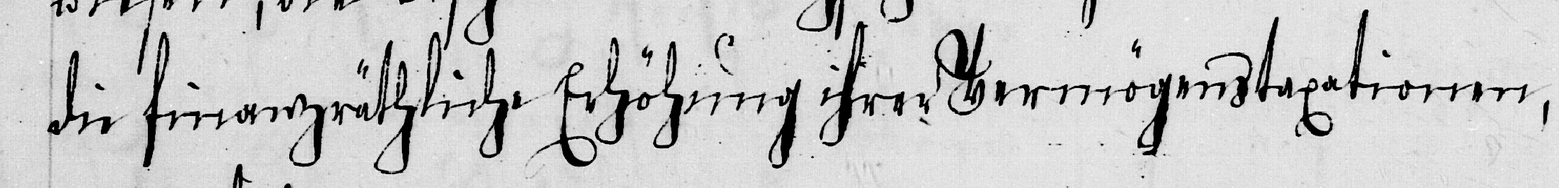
die finanzräthliche Erhöhung ihrer Vermögenstaxationen,
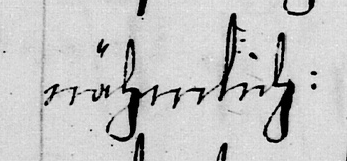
nähmlich:
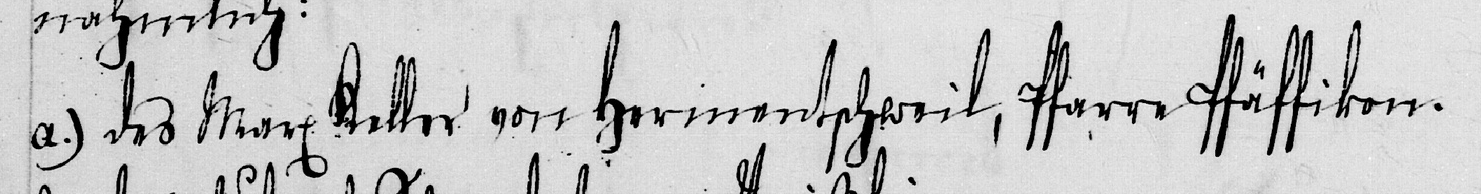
a.) des Marx Keller von Hermentschweil, Pfarre Pfäffikon.
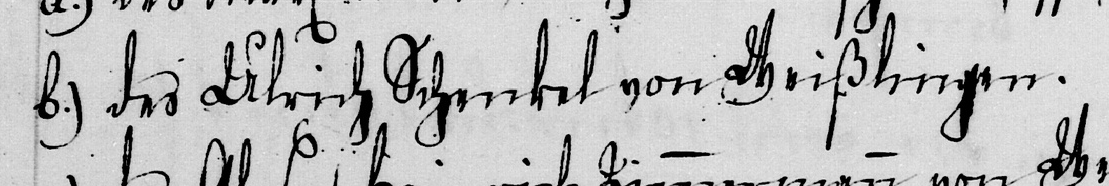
b.) des Ulrich Schenkel von Weißlingen.
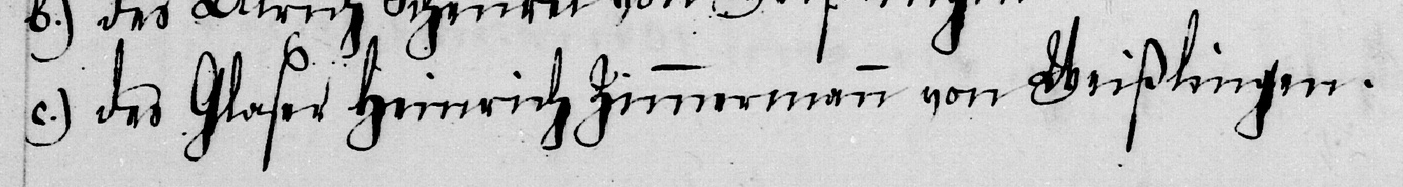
c.) des Glaser Heinrich Zimmermann von Weißlingen.
